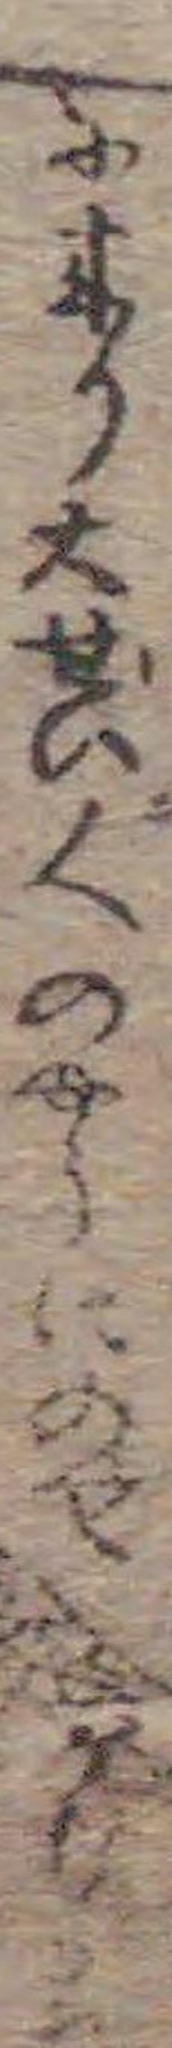に来り大ぜい人のやうにのせかけければ
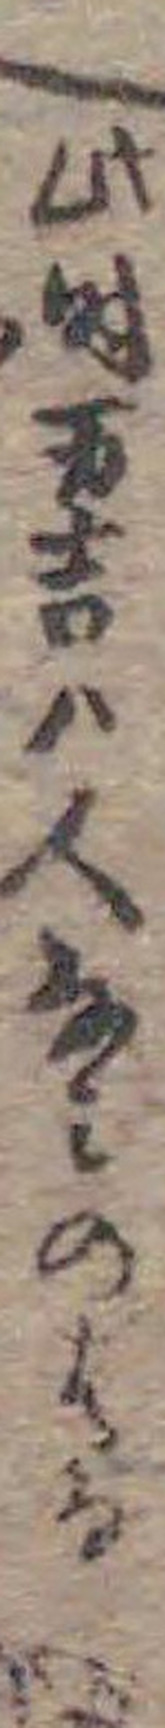此時万吉は人なみのはな
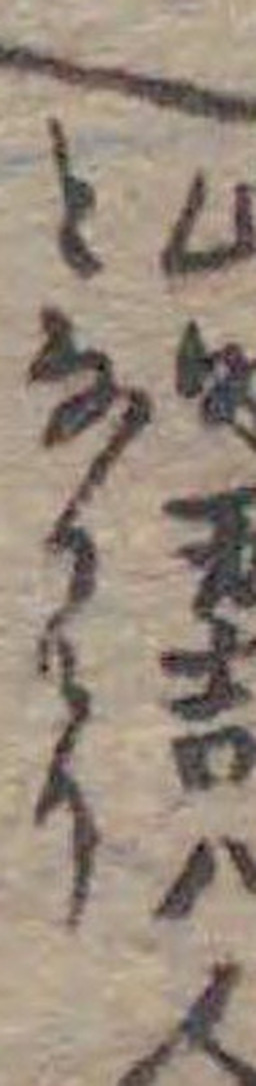となりけり
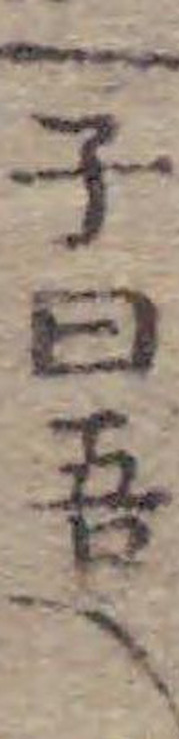子曰我
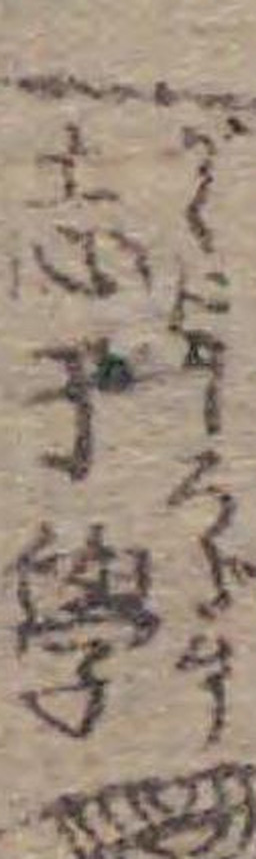志于学
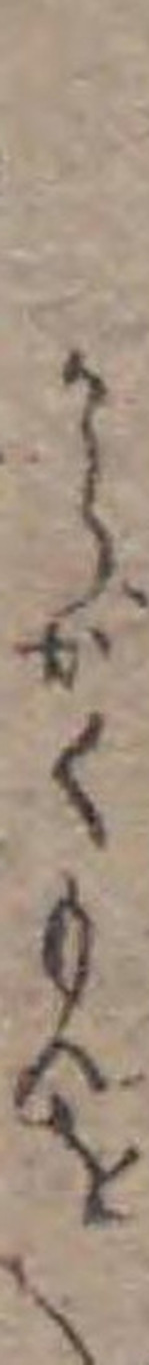からがくもんを
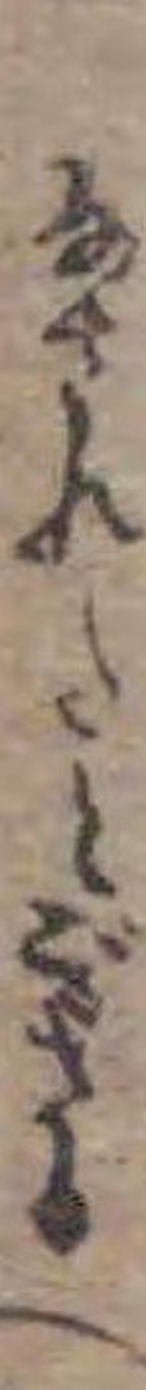なされたとござる
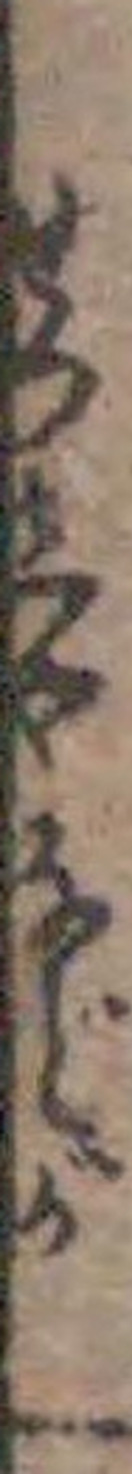せつしやなどが
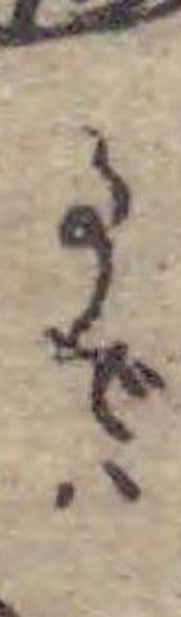事では
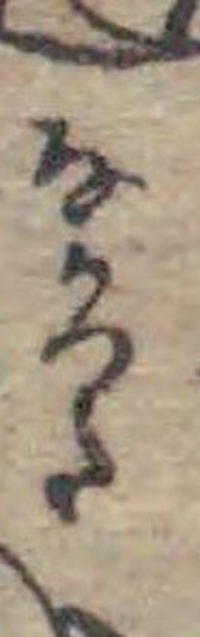なかつた

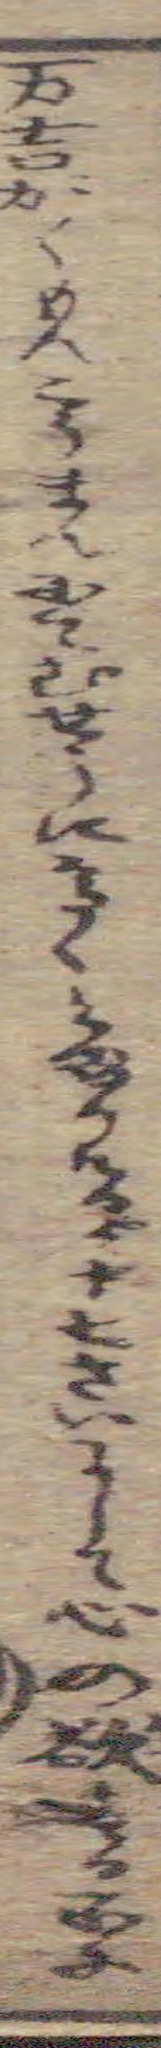万吉かくもんこうまんにてむせうに高くとまりけるが十七さいにして心の欲する所に
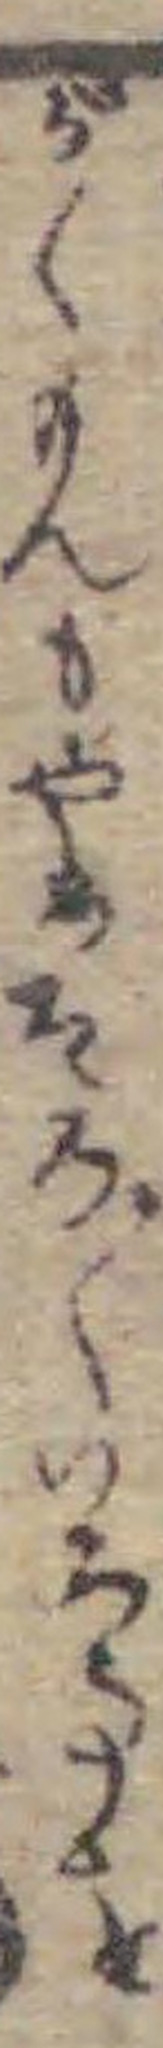がくもんもやめそろ〳〵いろ毎を
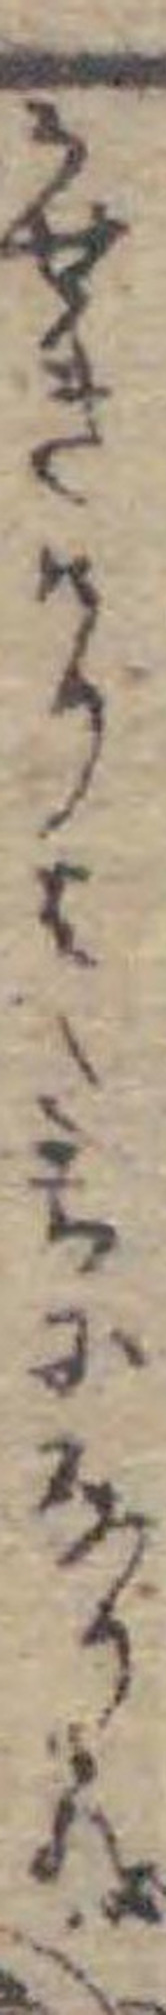かせきけりはたちになりければ
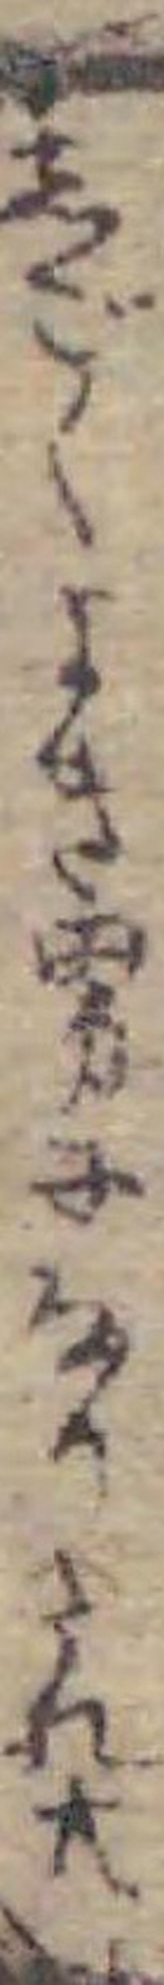しごくよき男になりたれ共
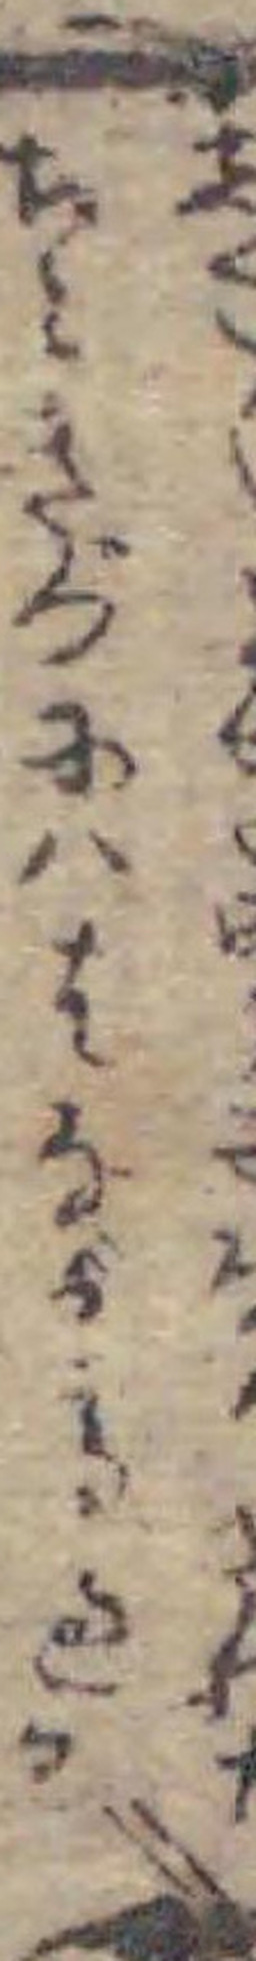ちときづにははなが高過る
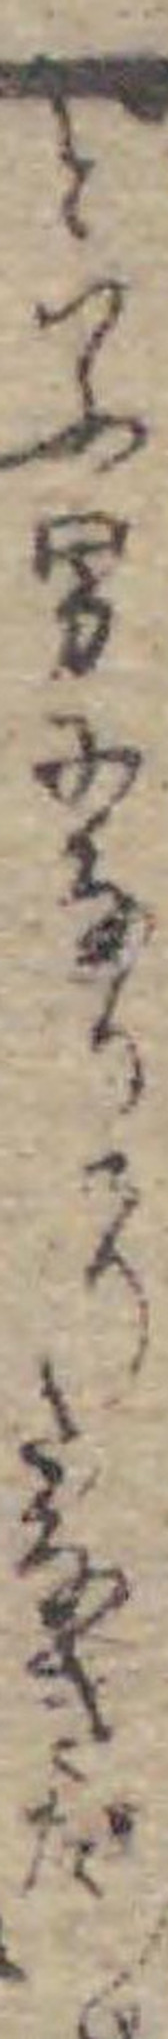といふ男になりけりたなきだに
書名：鼻峰高慢男 : 2巻
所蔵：国立国会図書館 National Diet Library, JAPAN
